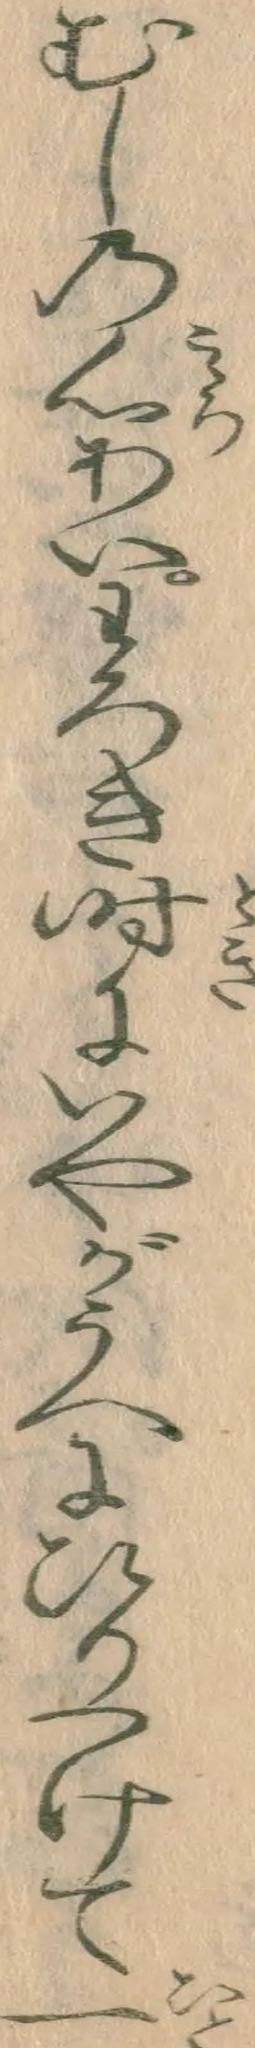むしの心あい。わろき時にいやがうへにひりつけて一
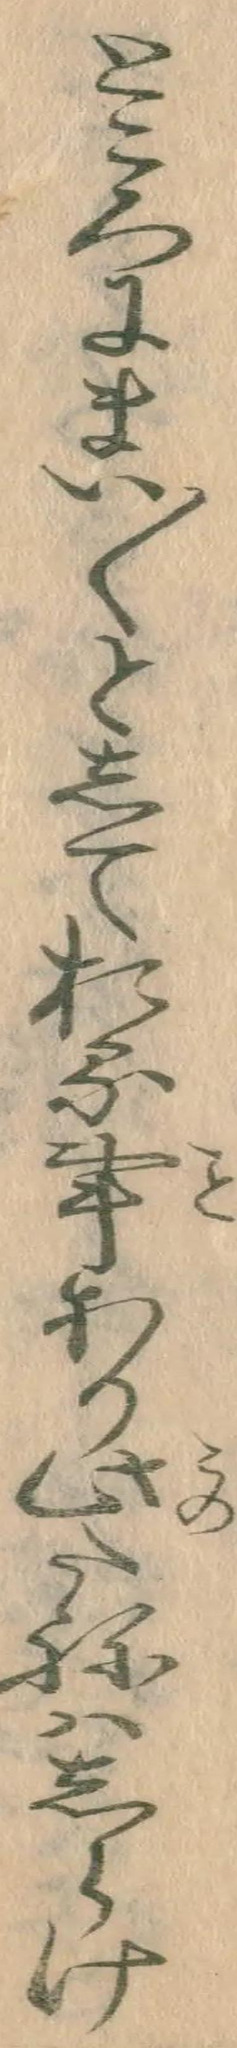ところにまい〳〵としておる事あり此たねはしらけ
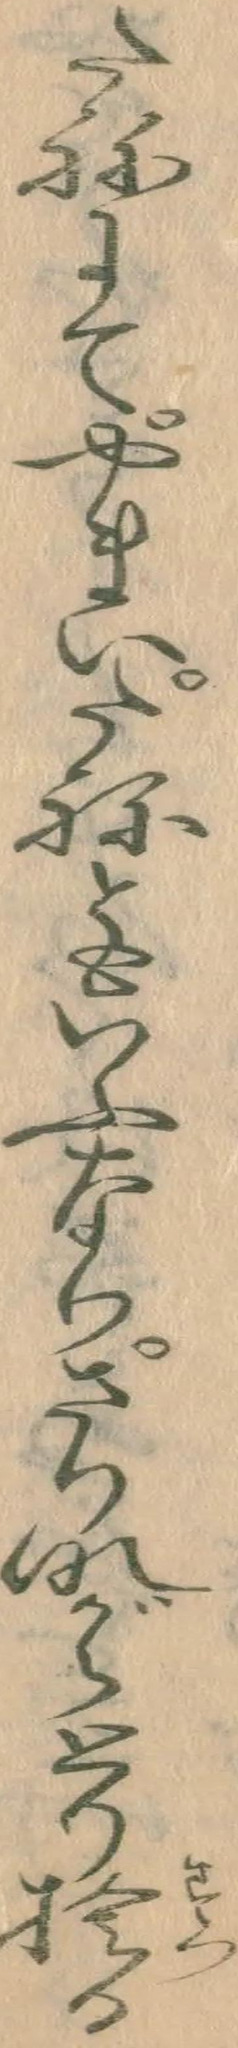たねにて。やまい。たねともいふなり。さりながらとり捨る
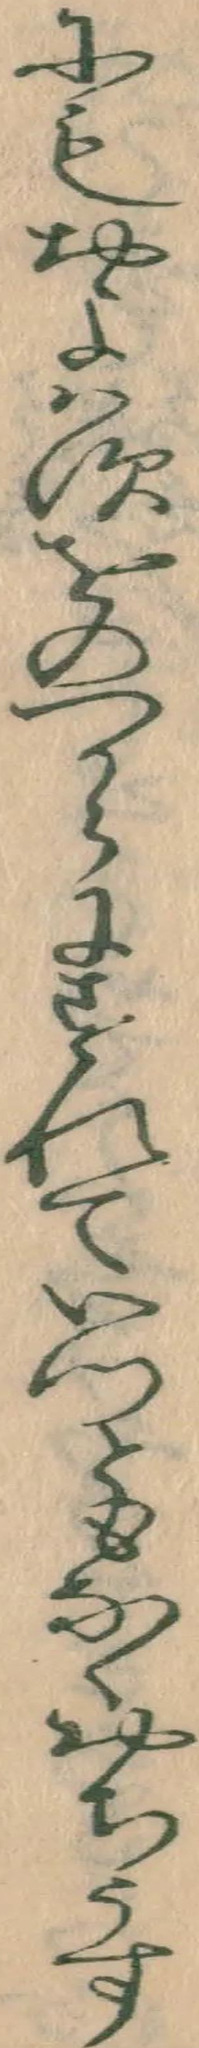にもおよはすをのつからにすれていつともなくおちうす
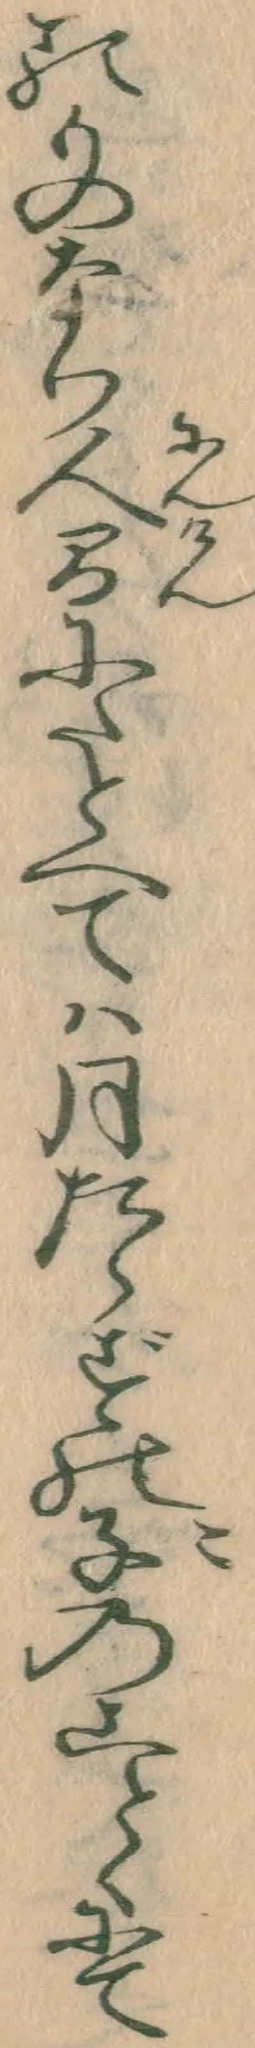るものなり人間にたとへては月たらずの子のことくにて
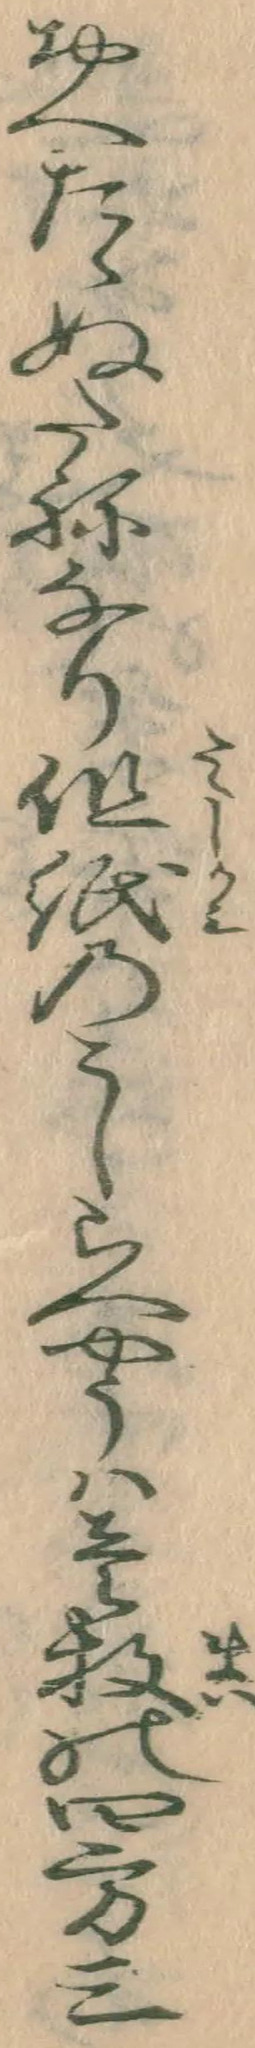おへたゝぬたねなり但紙のこしらへやうは壱枚の四方三
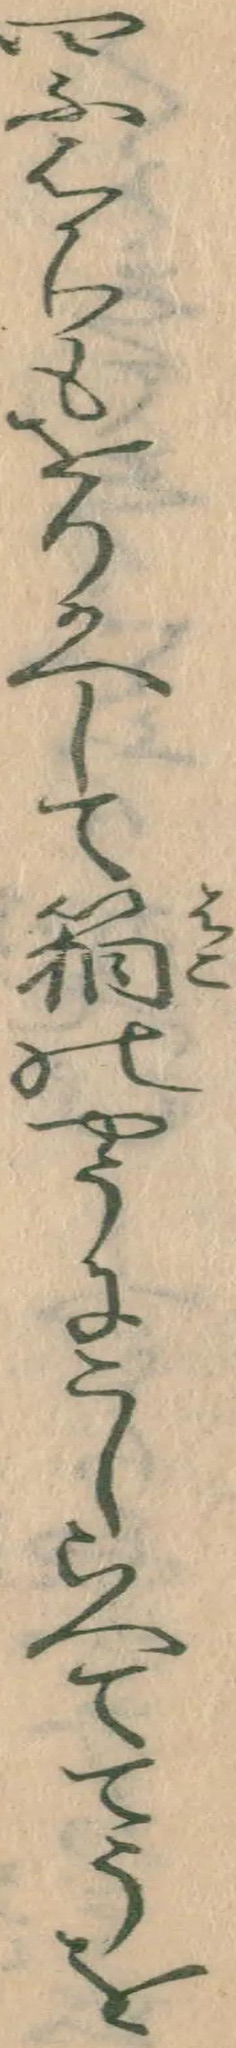四ふはかりもをりかへして箱のやうにこしらへててうを
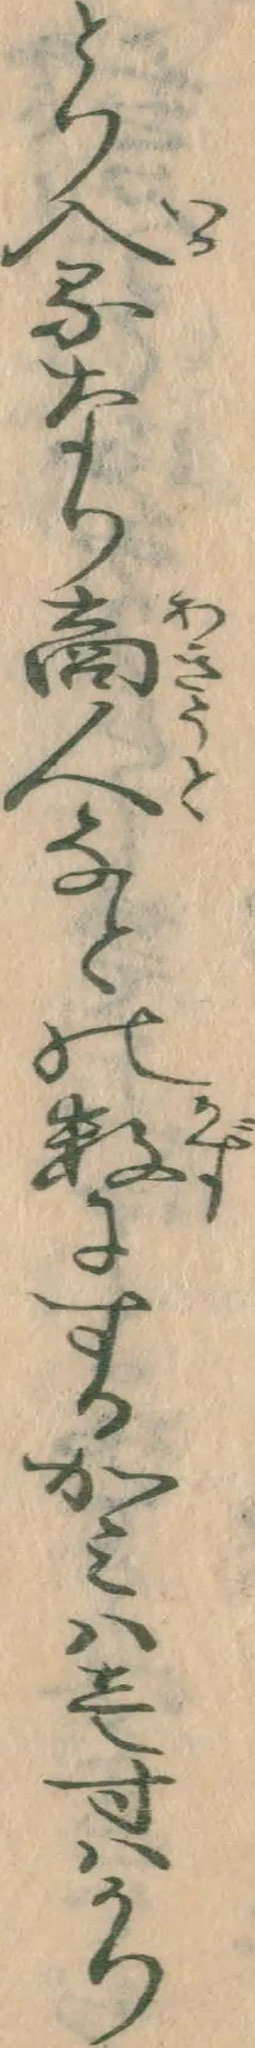とり入るなり商人なとの数にするかみは壱寸はかり
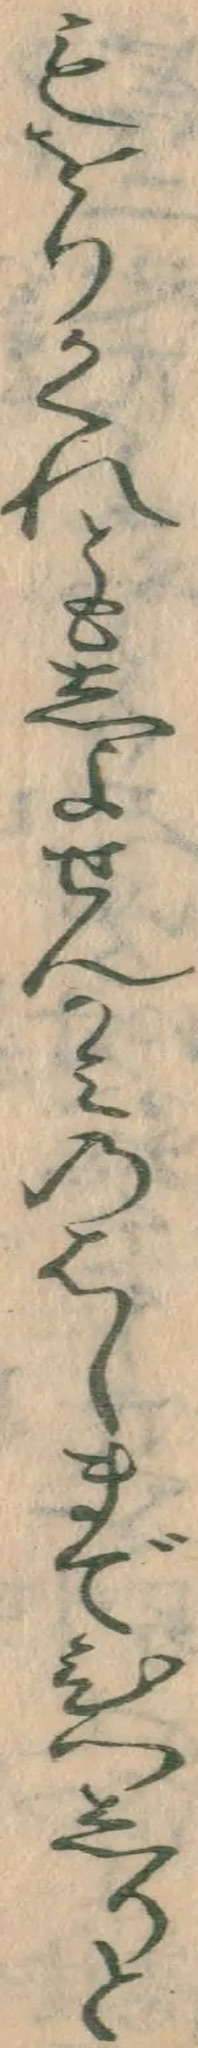もをりかくれともしよせんかみのはしまでひつしりと
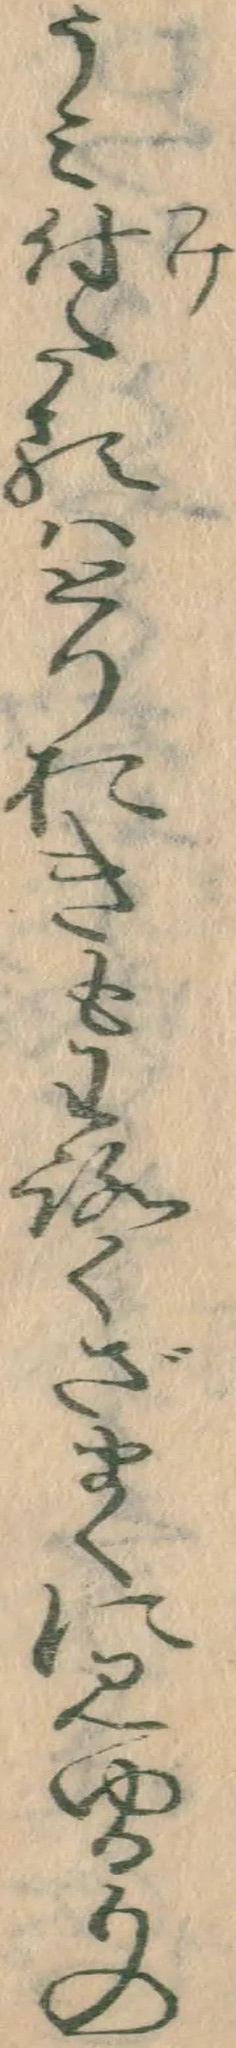うみ付たるはとりおきもわろくざまくに見ゆるもの
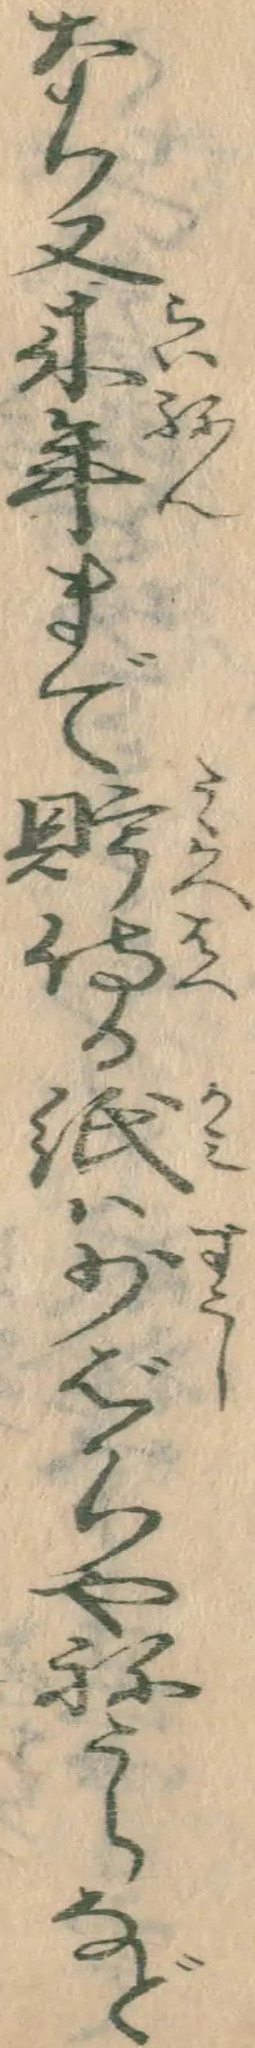なり又来年まで貯侍る紙は少ばかりやねうらなど
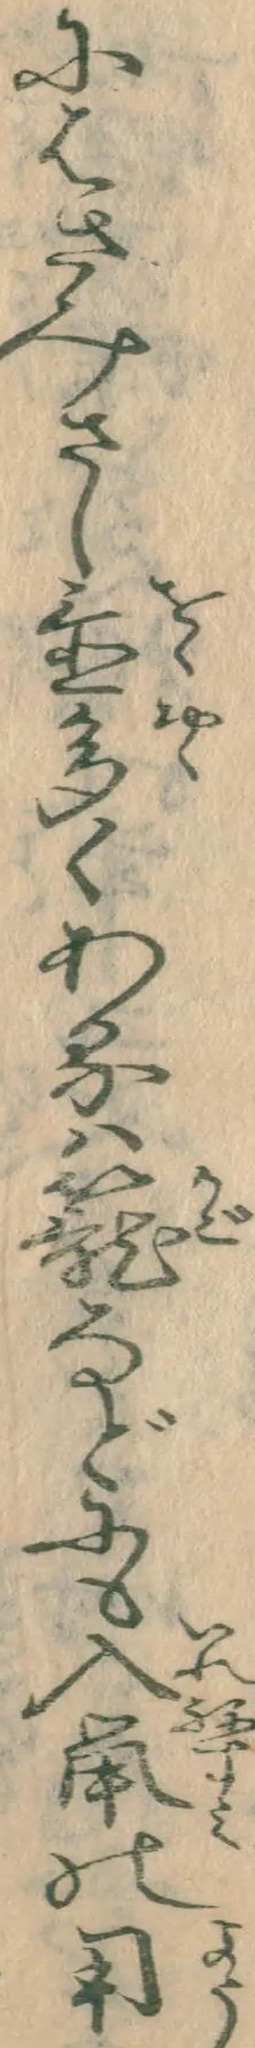にはさみさし置多くあるは籠などにも入鼠の用
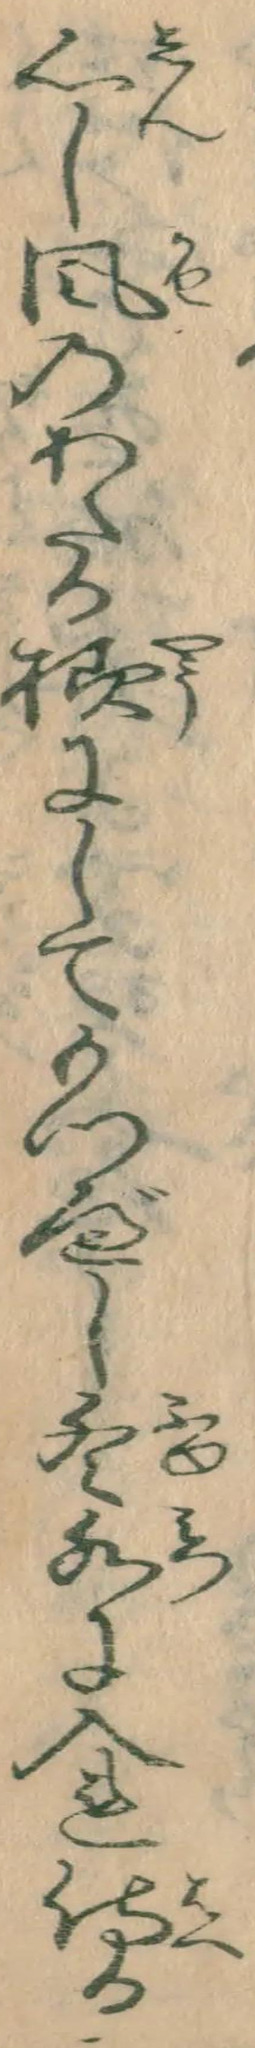心し風のあたる様にしてもつべし冬水に入れ侍る

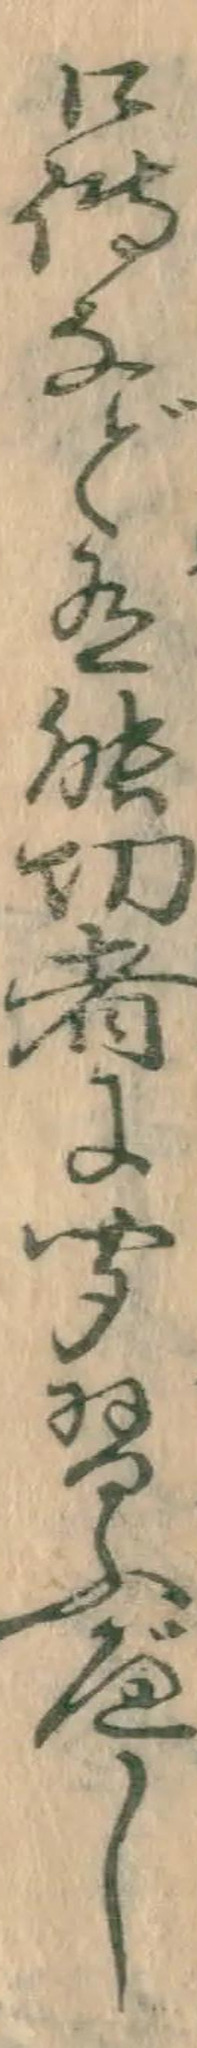口伝など有能巧者に聞習ふべし
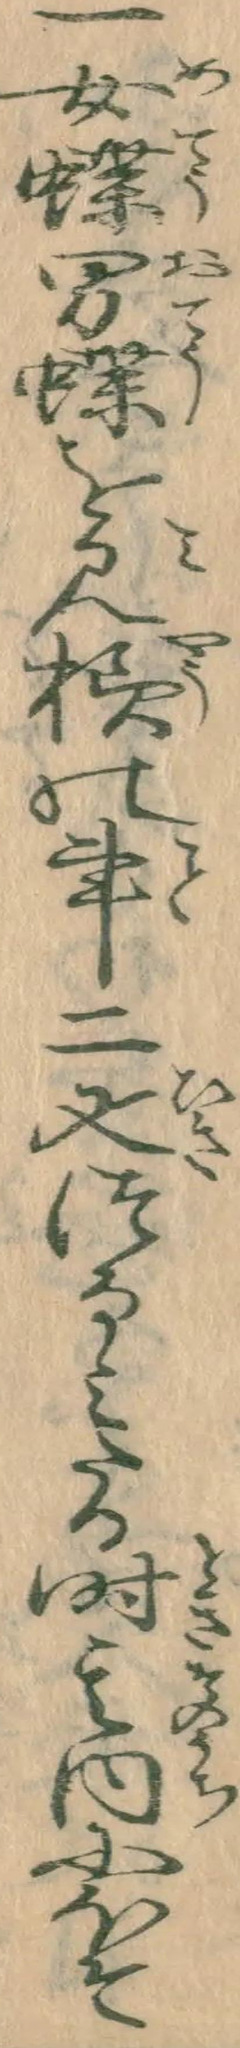一女蝶男蝶を見様の事二疋つるみたる時其内にほそ
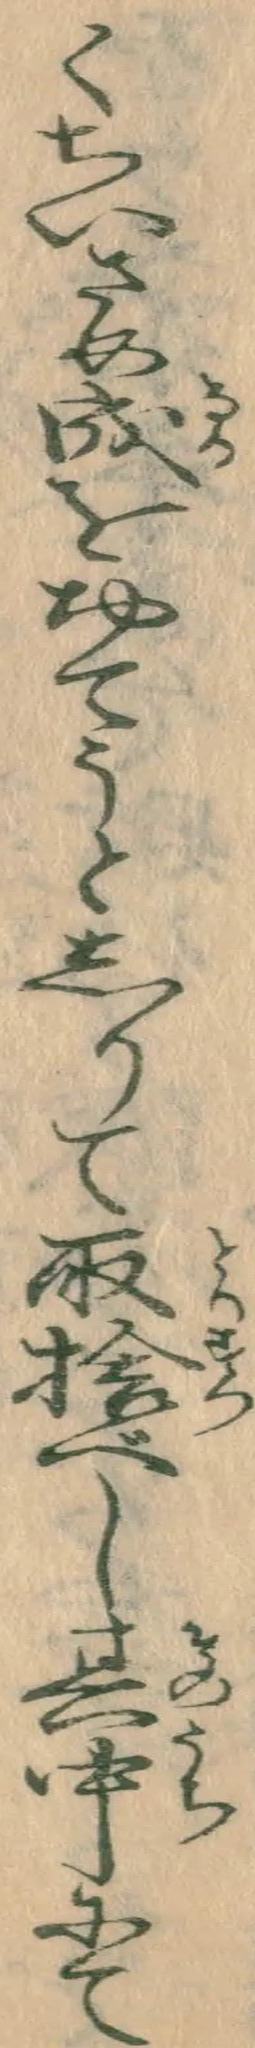くちいさめ成をおてうとしりて取捨べし其中にて
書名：蚕飼養法記
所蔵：国立国会図書館 National Diet Library, JAPAN
